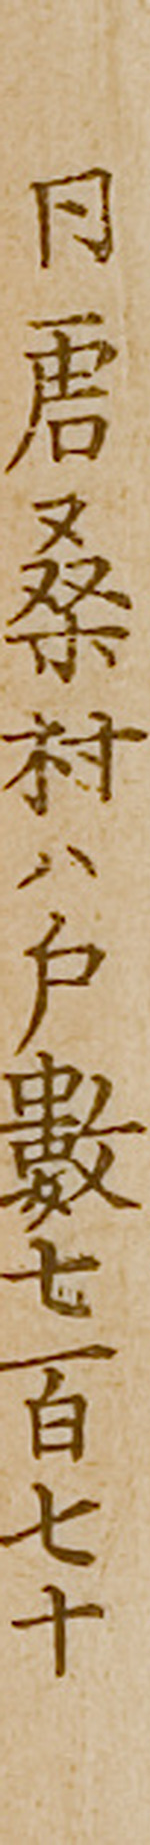同唐桑村は戸數七百七十
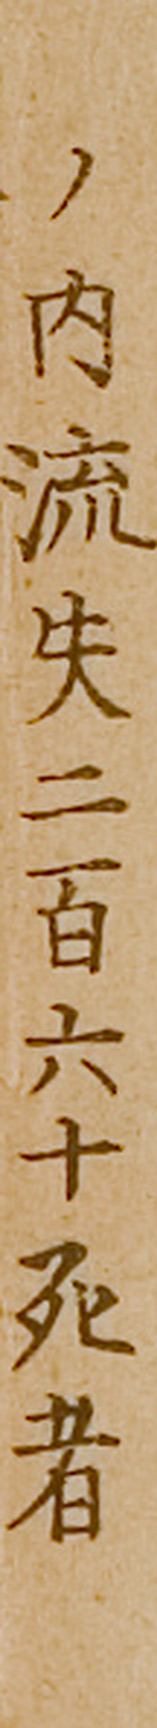の内流失二百六十死者
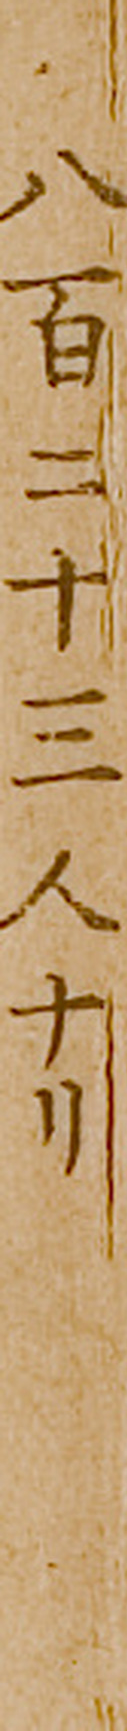八百二十三人なり
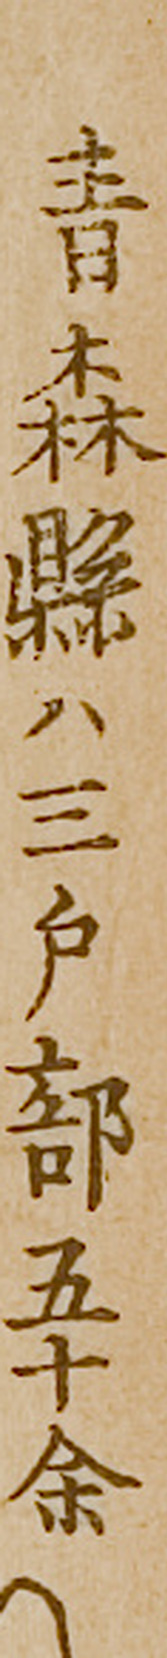青森縣は三戸部五十余
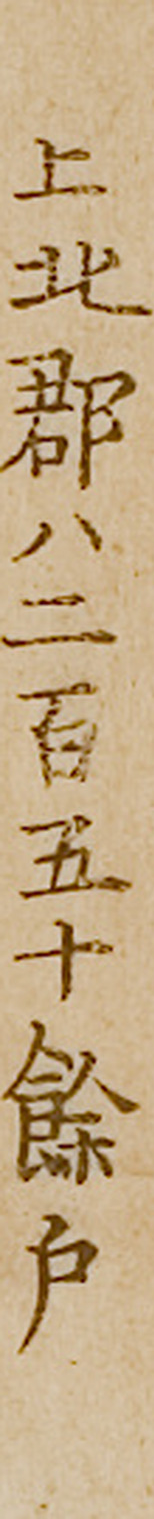上北郡は二百五十餘戸
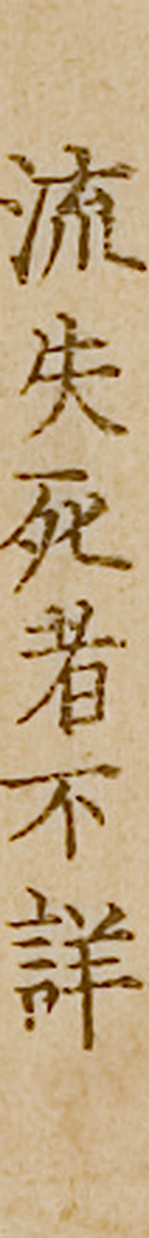流失死者不詳
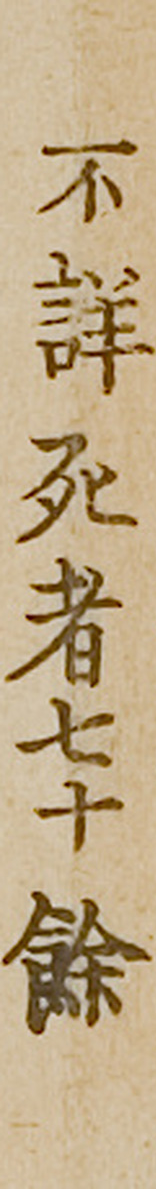不詳死者七十餘
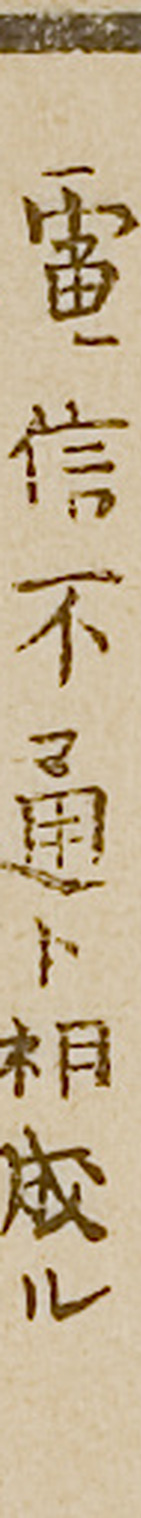電信不通と相成る
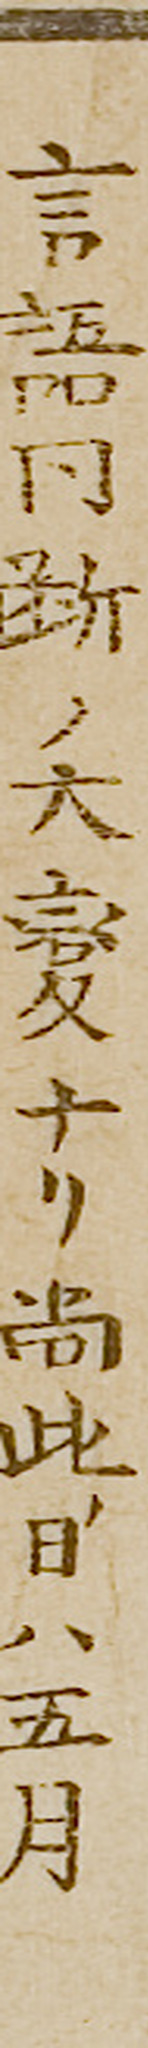言語同断の大變なり尚此の日は五月
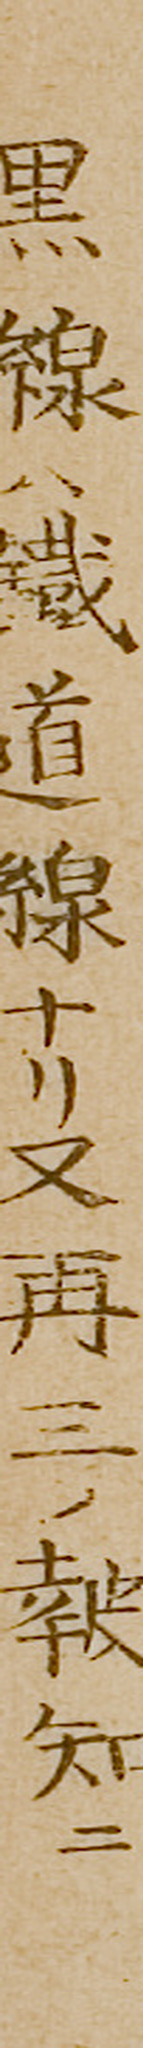黒線は鐡道線なり又再三の報知に
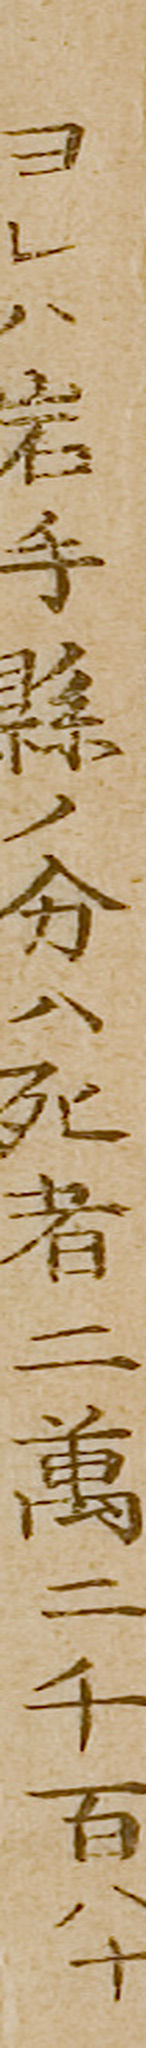よれは岩手縣の分は死者二萬二千百八十
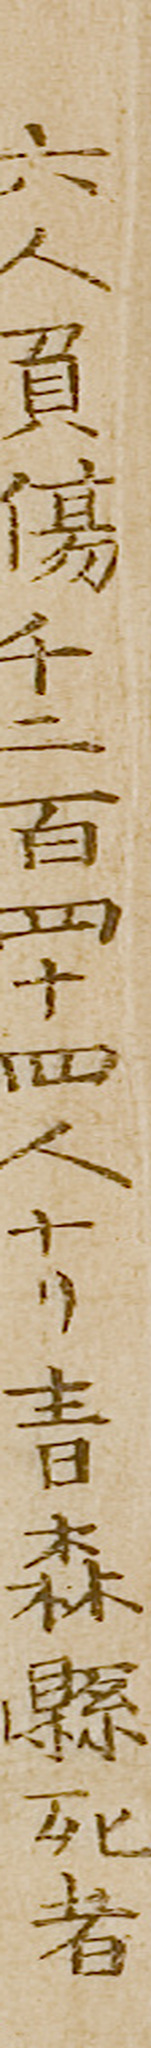六人負傷千二百四十四人なり青森縣死者
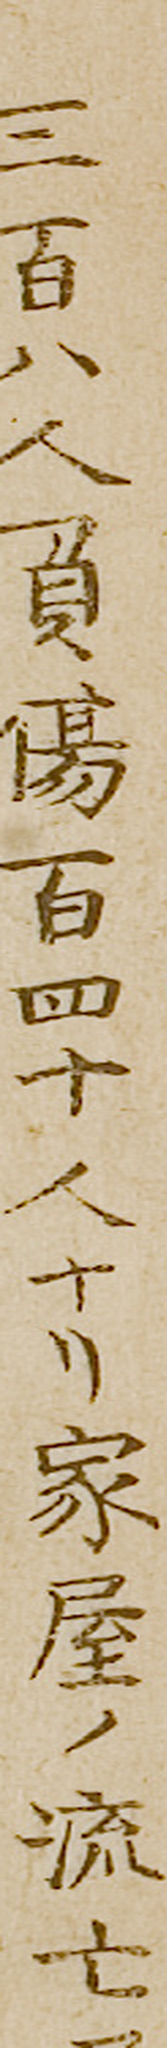三百八人負傷百四十人なり家屋の流亡及破壊
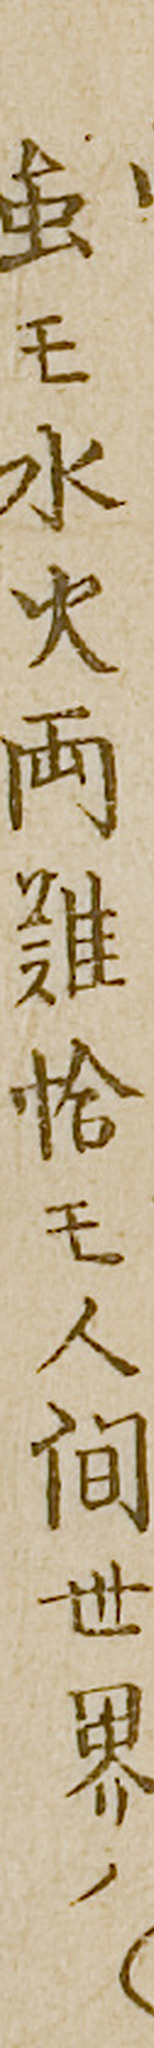雖も水火両難恰も人間世界の
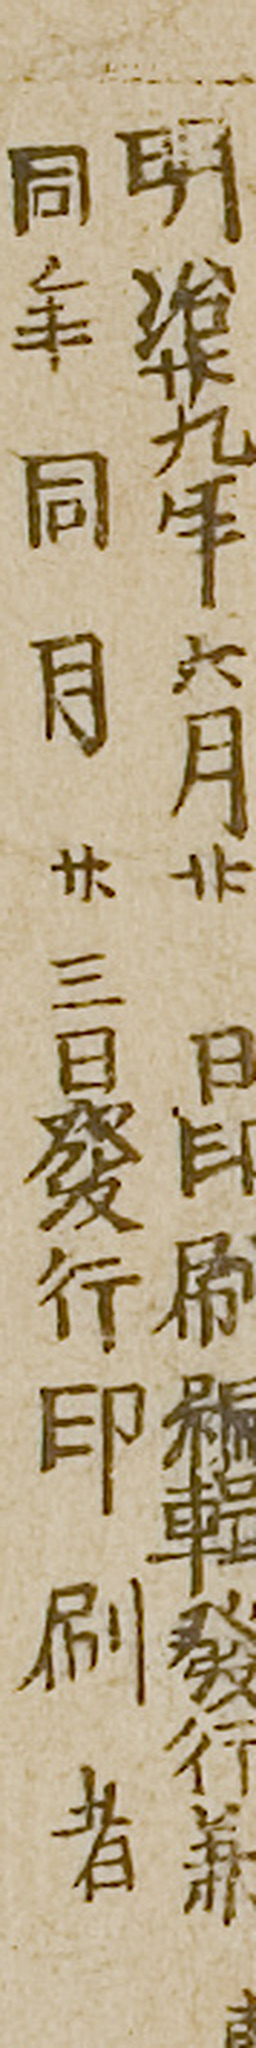同年同月廿三日發行印刷者
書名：東北海岸の海嘯
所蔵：東京大学総合図書館 General Library in the University of Tokyo, JAPAN
